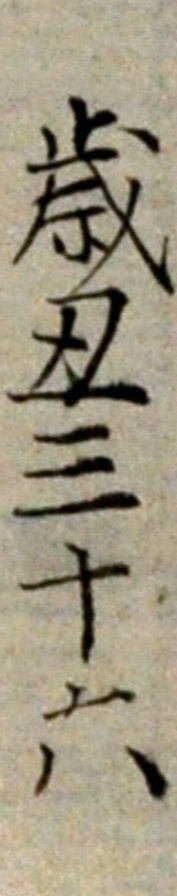歳丑三十六
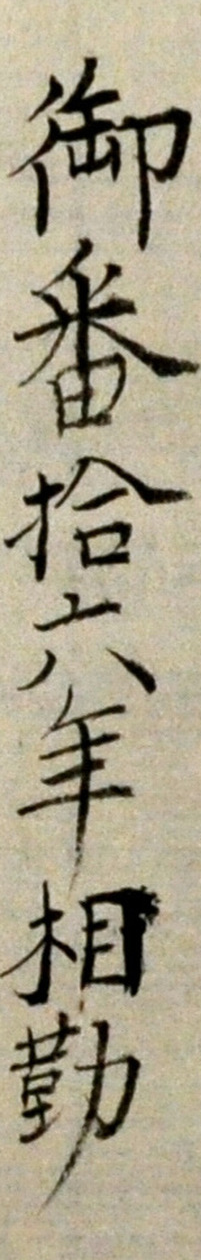御番拾六年相勤
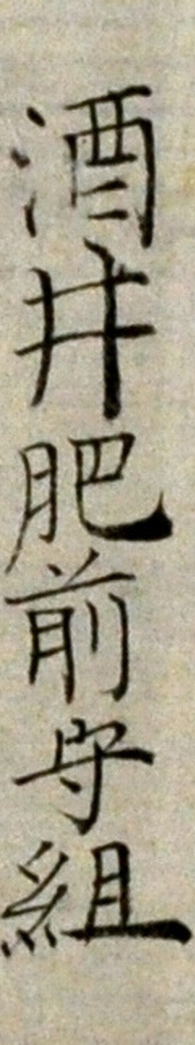酒井肥前守組
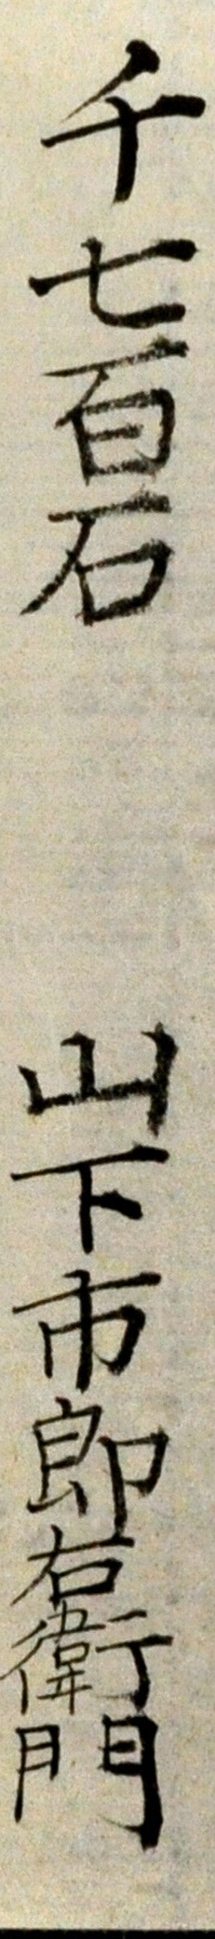千七百石山下市郎右衛門
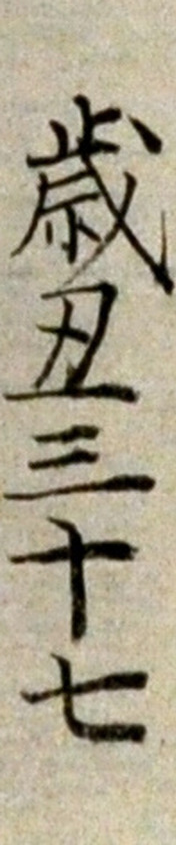歳丑三十七
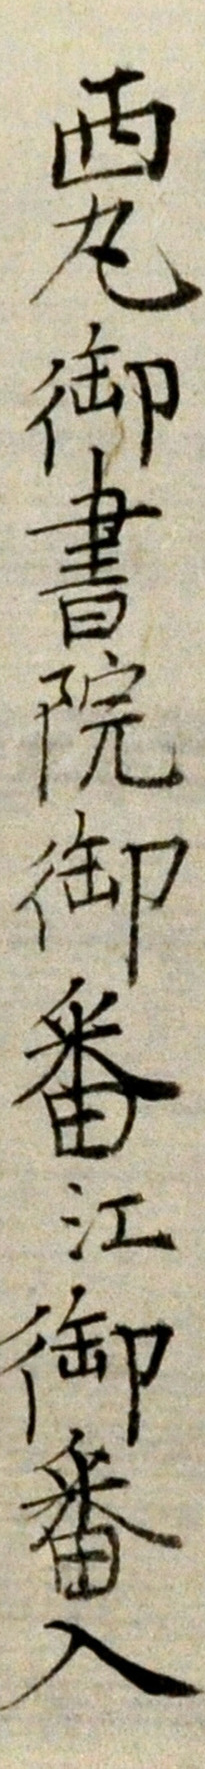西丸御書院御番江御番入
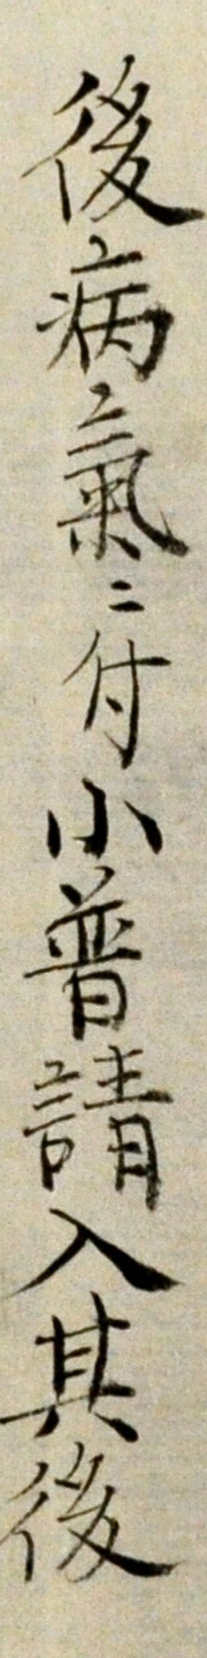後病気ニ付小普請入其後
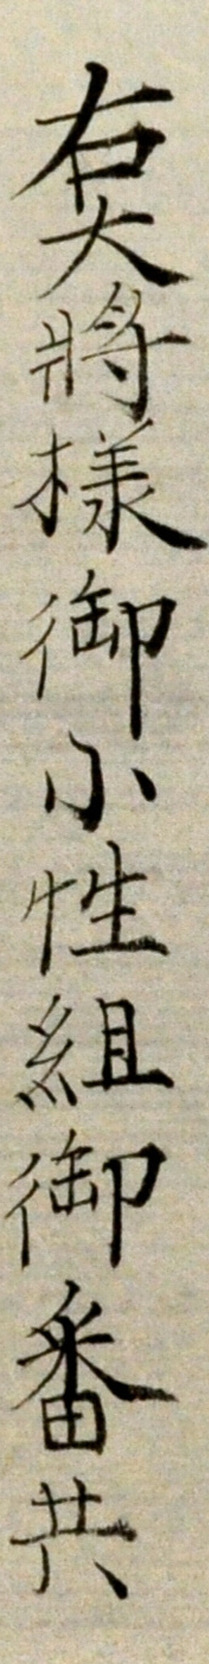右大将様御小性組御番共
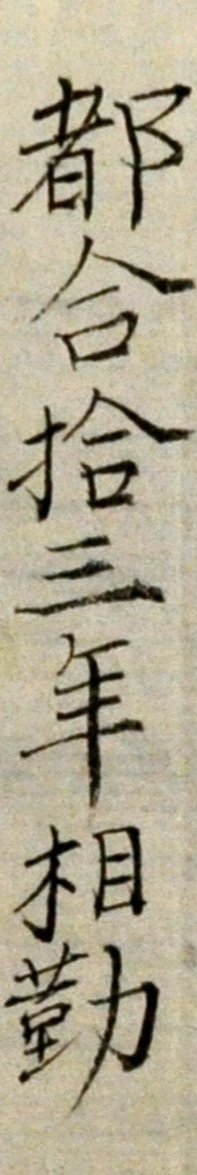都合拾三年相勤
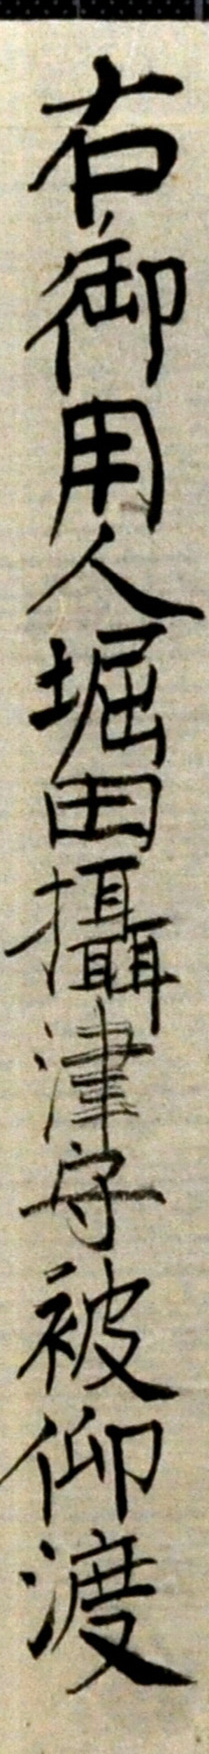右御用人堀田攝津守被仰渡
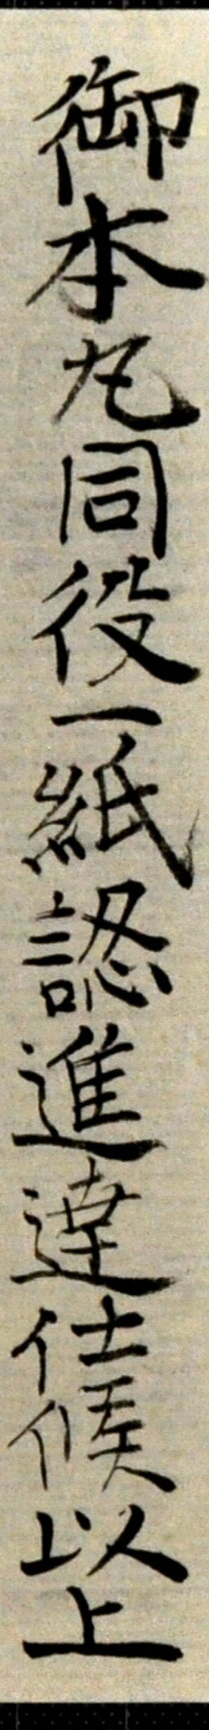御本丸同役一紙認進達仕候以上

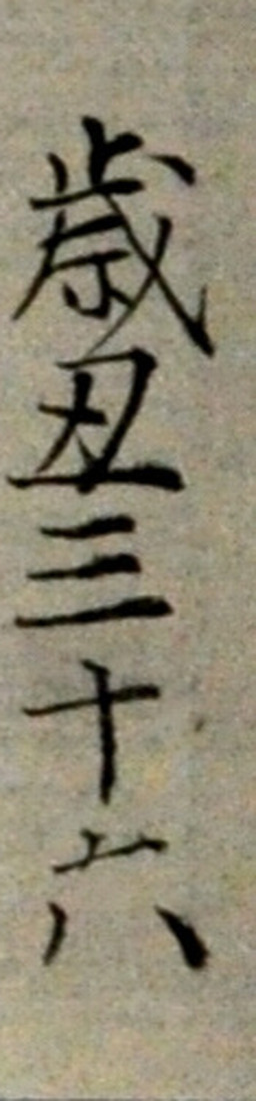歳丑三十七
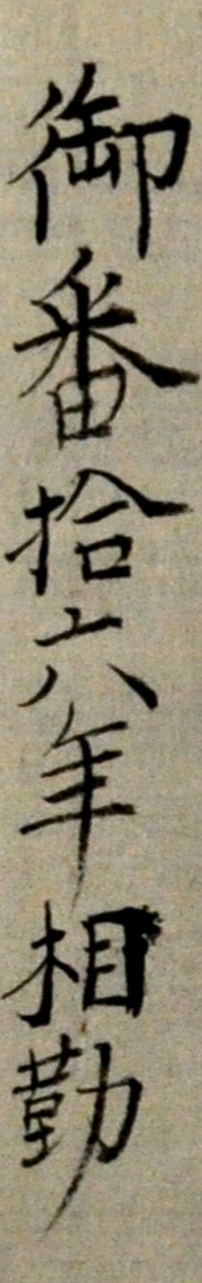御番拾六年相勤
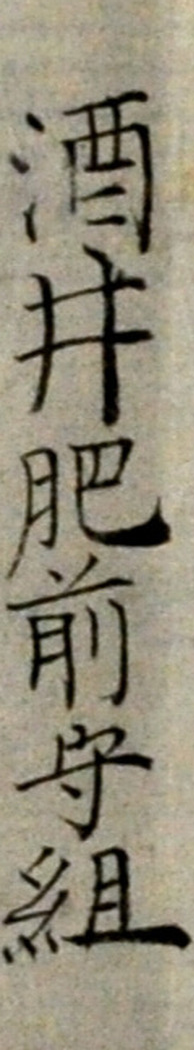酒井肥前守組
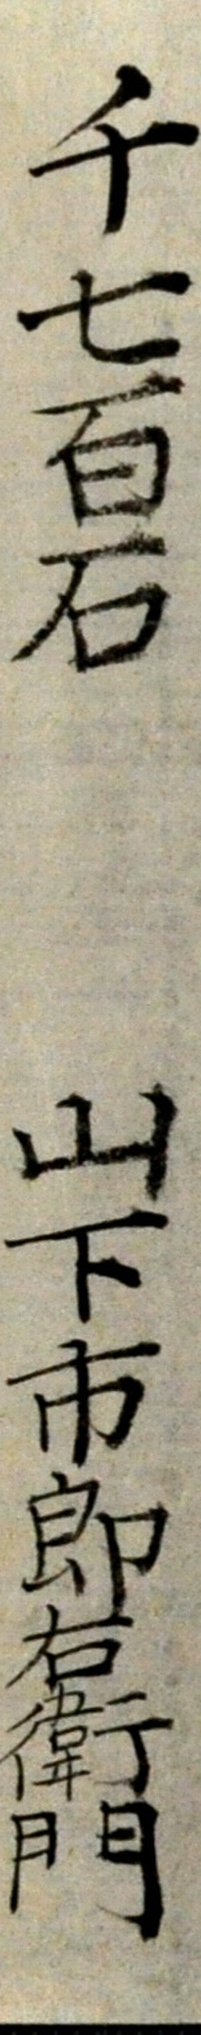千七百石山下市郎右衛門
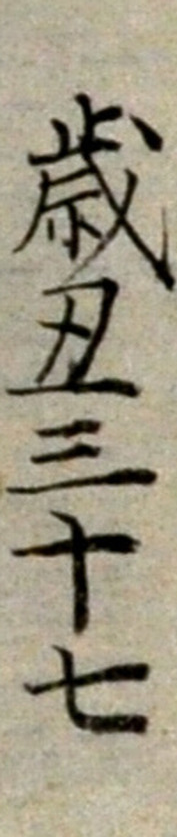歳丑三十七
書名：若年寄御役中御調書付
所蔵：伊那市立高遠町図書館・合同会社AMANE
